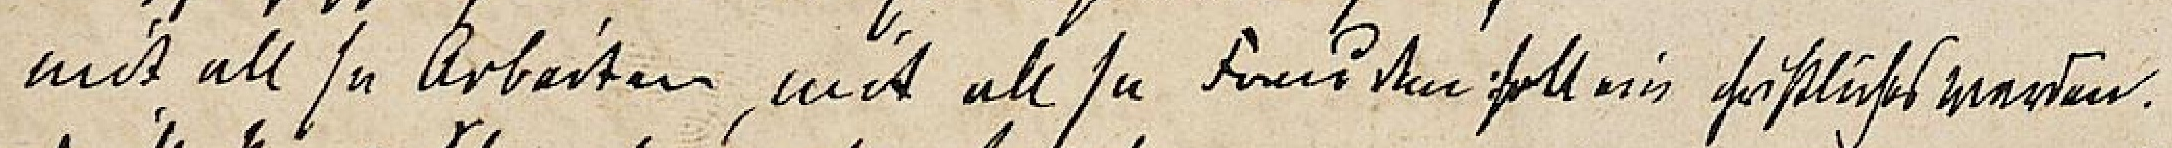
mit all sn Arbeiten, mit all sn Freuden soll ein christliches werden.
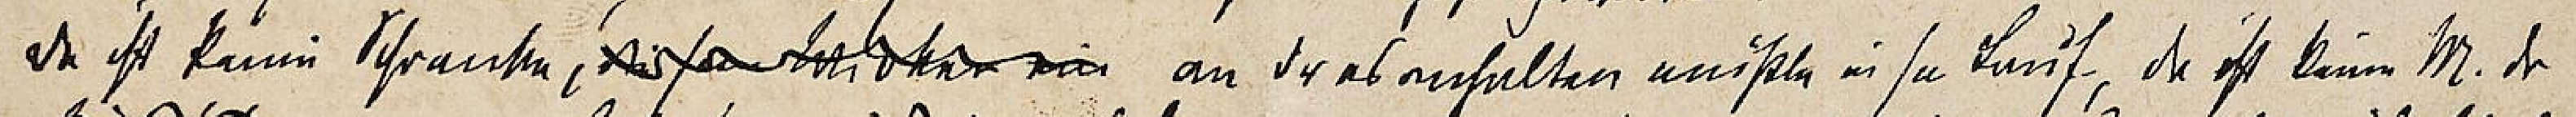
da ist keine Schranke, die snm Wirken ein an dr es anhalten müßte in sm Lauf, da ist kein M dr
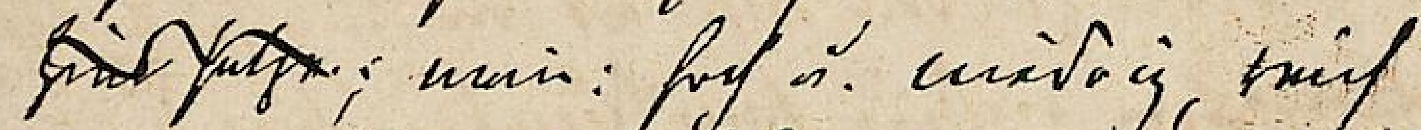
Ziel setze; nein: hoch u. niedrig, reich
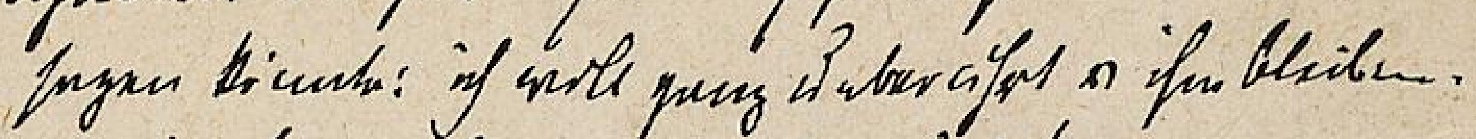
sagen könnte: ich will ganz unberührt v. ihm bleiben.
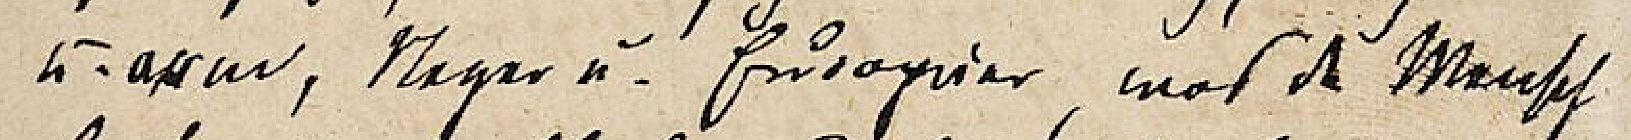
u arm, Neger u. Europäer, was da Mensch
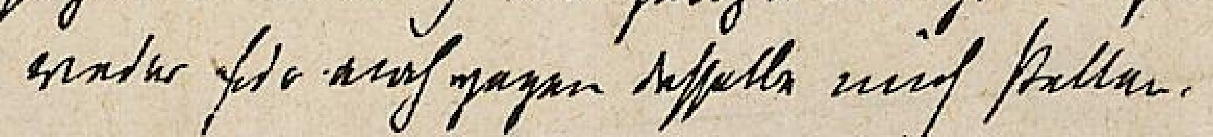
weder für noch gegen dasselbe mich stellen.
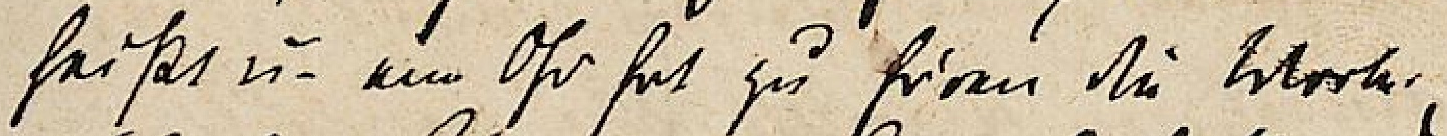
heißt u. ein Ohr hat zu hören die Worte
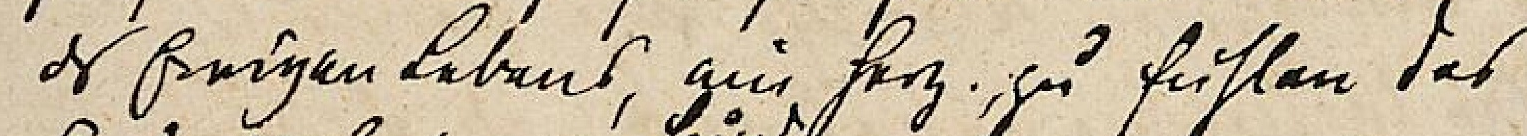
des Ewigen Lebens, ein Herz zu fühlen das
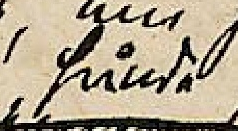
Hände
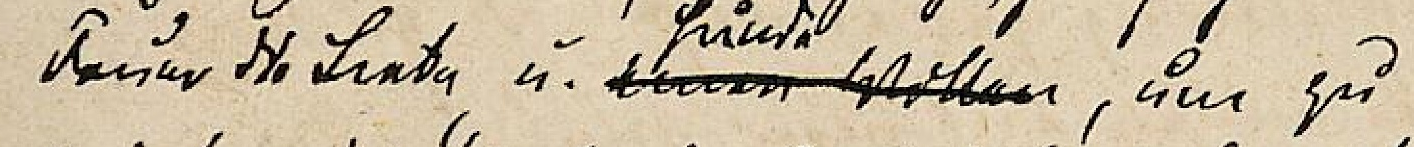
Feuer der Liebe, u einen Willen, um zu
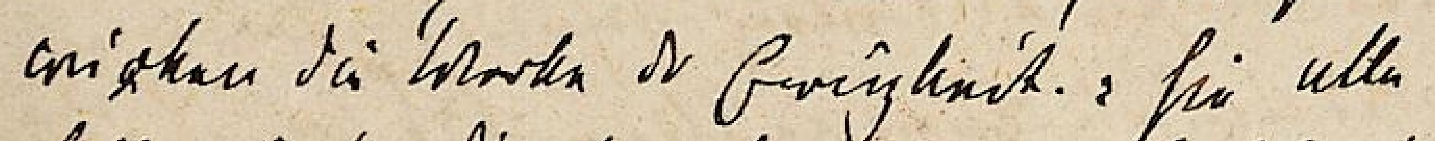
wirken die Worte dr Ewigkeit: sie alle
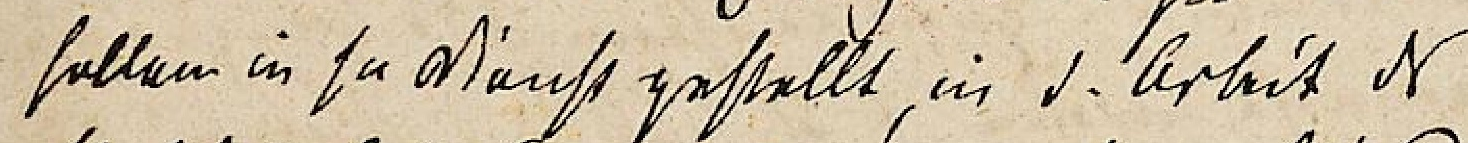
sollen in sn Dienst gestellt, in d. Arbeit ds
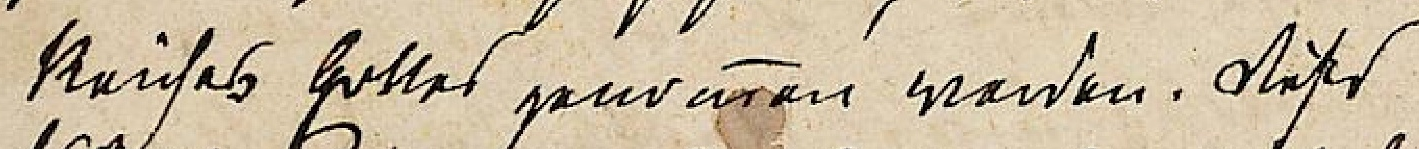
Reiches Gottes genomen werden.
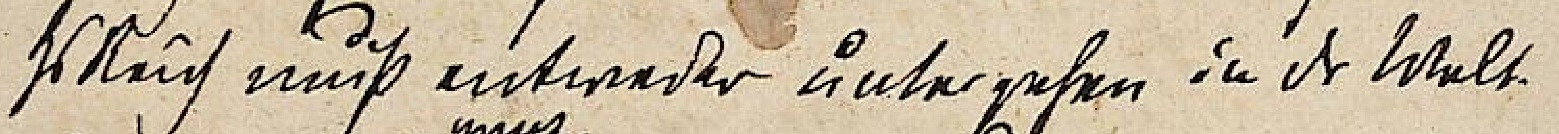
Gs Reich muß entweder untergehen in dr Welt
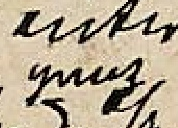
ganz
